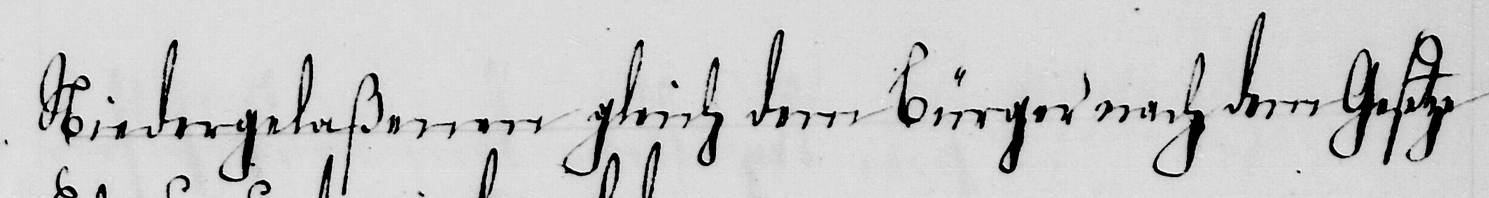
Niedergelaßenen gleich dem Bürger nach dem Gesetze
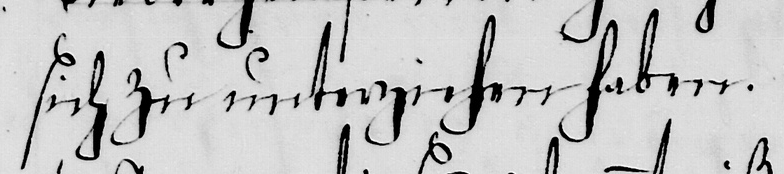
sich zu unterziehen haben.
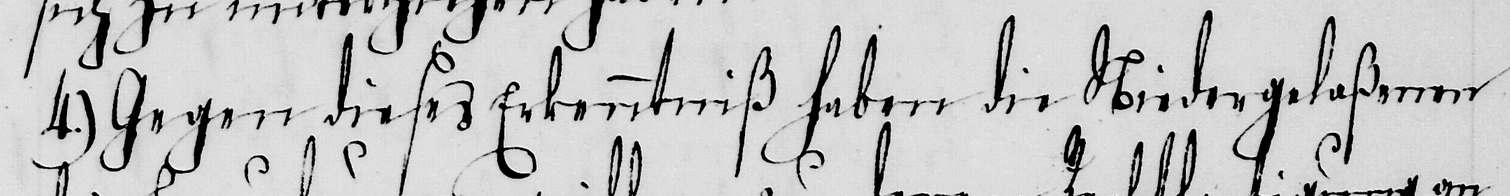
4.) Gegen dieses Erkentniß haben die Niedergelaßenen
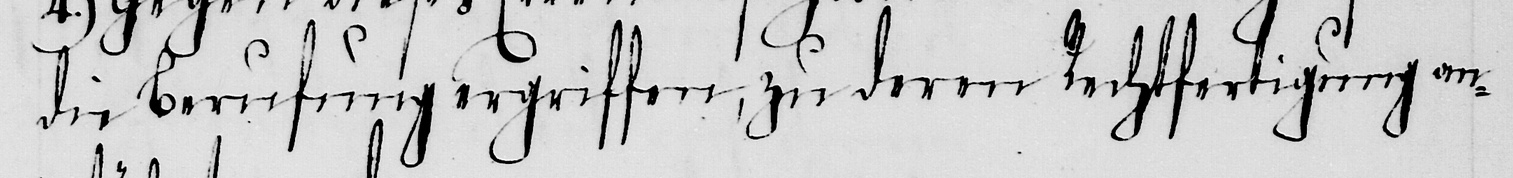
die Berufung ergriffen, zu deren Rechtfertigung an¬
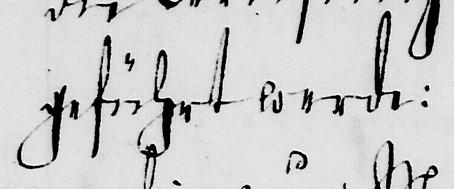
geführt werde:
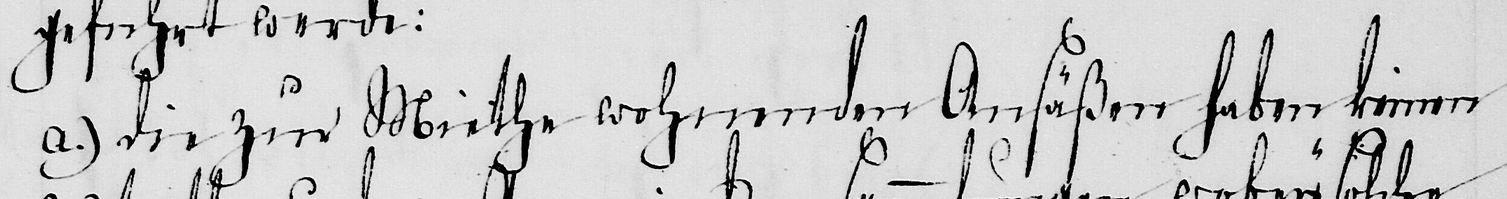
a.) die zur Miethe wohnenden Ansäßen haben keinen
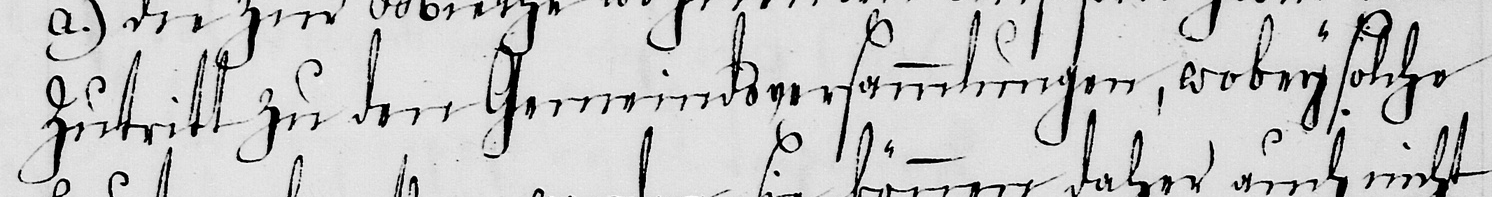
Zutritt zu den Gemeindsversammlungen, wobey solche
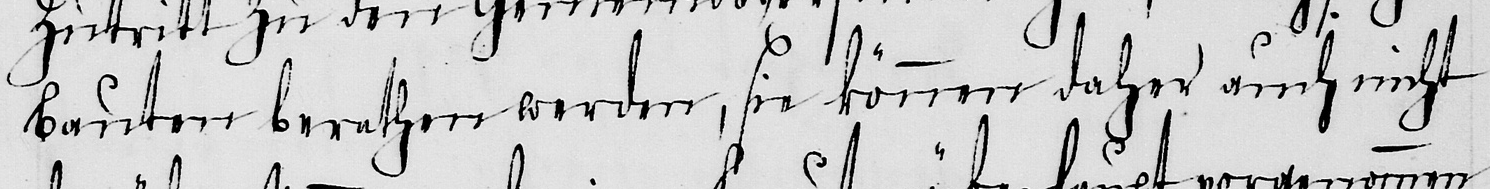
Bauten berathen werden, sie können daher auch nicht
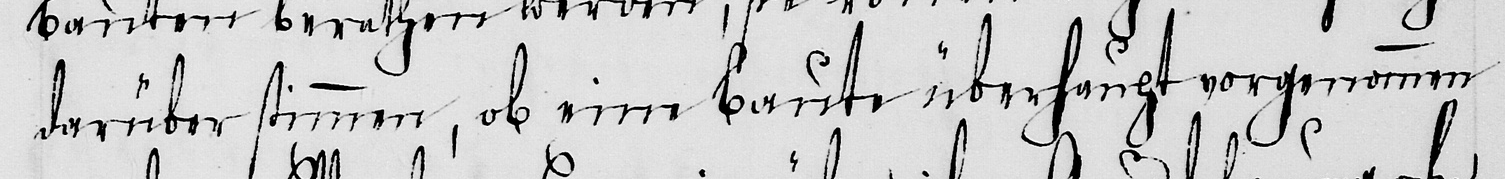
darüber stimmen, ob eine Baute überhaupt vorgenommen
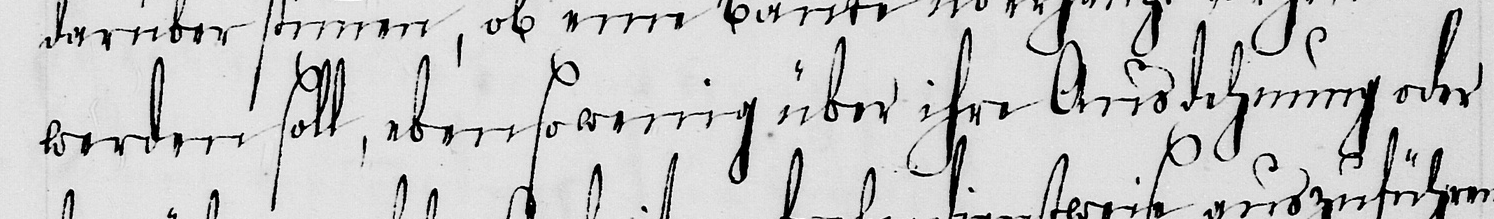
werden soll, ebensowenig über ihre Ausdehnung oder
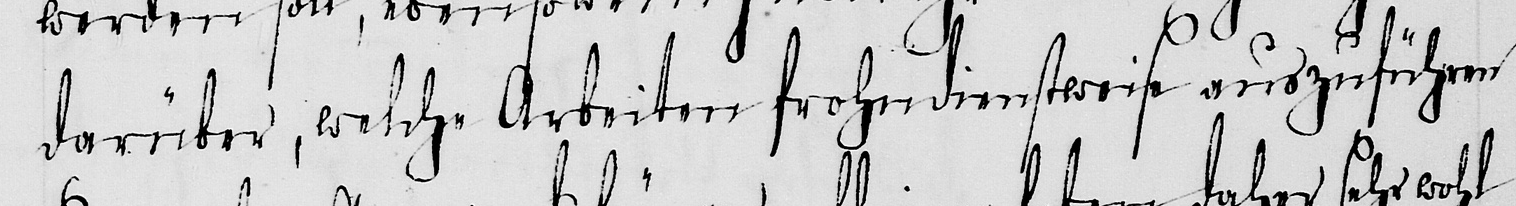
darüber, welche Arbeiten frohndienstweise auszuführen
